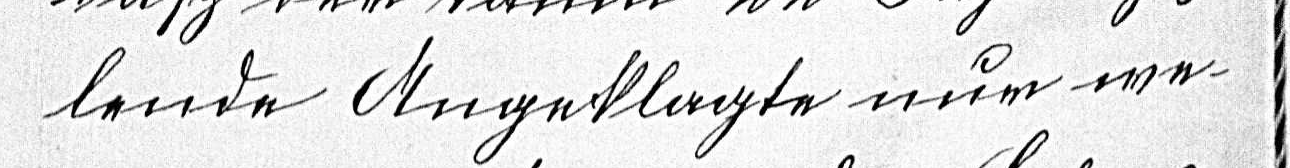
lende Angeklagte nur we¬
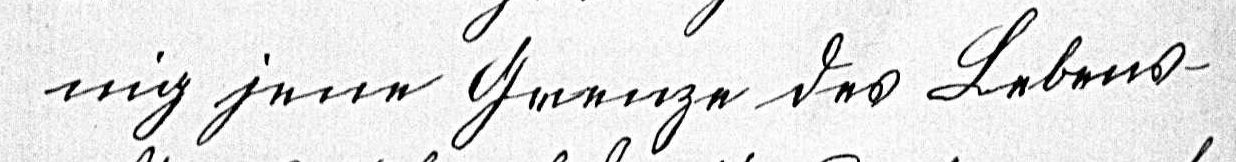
nig jene Grenze des Lebens¬
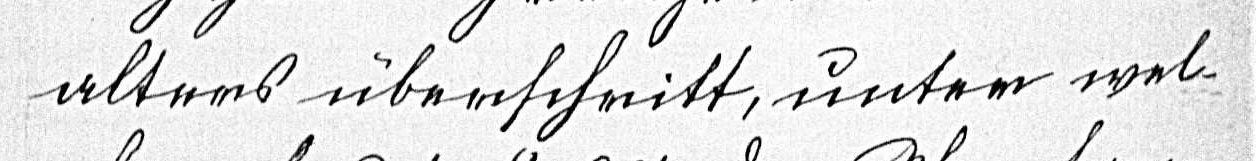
alters überschritt, unter wel¬
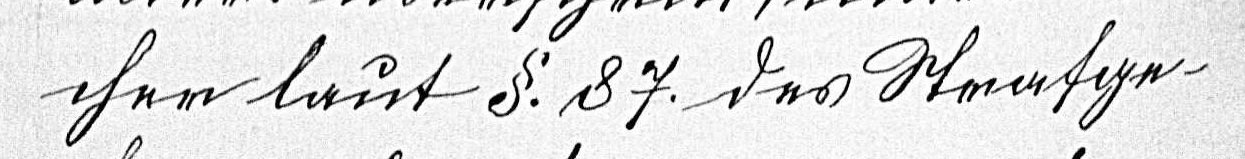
cher laut §87 des Strafge¬
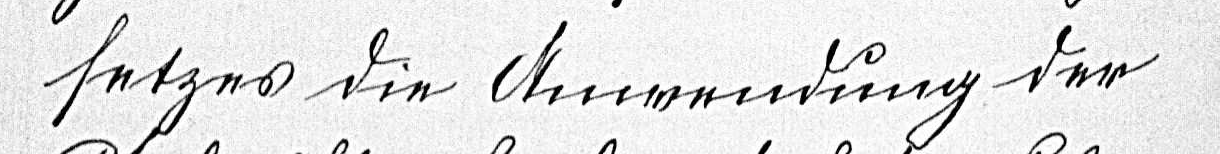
setzes die Anwendung der
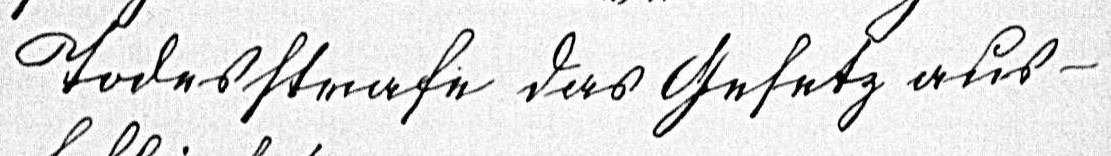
Todesstrafe das Gesetz aus¬
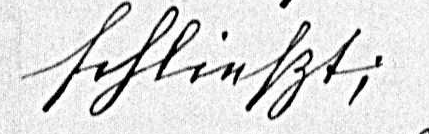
schließt;
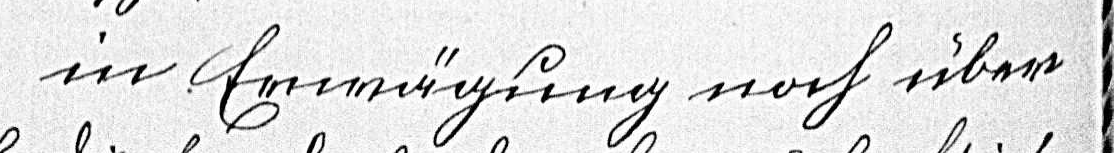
In Erwägung noch über
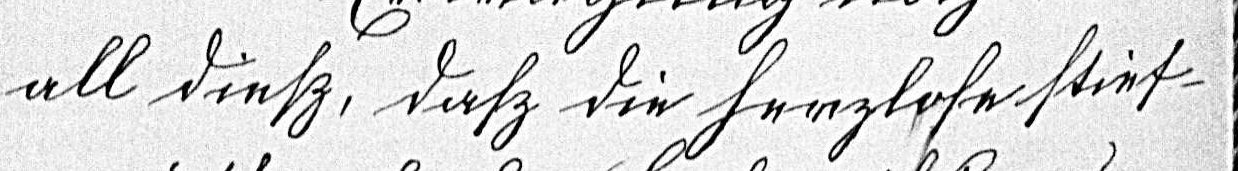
all dieß, daß die herzlose stief¬
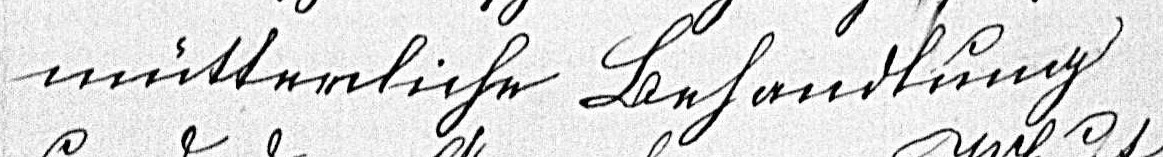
mütterliche Behandlung
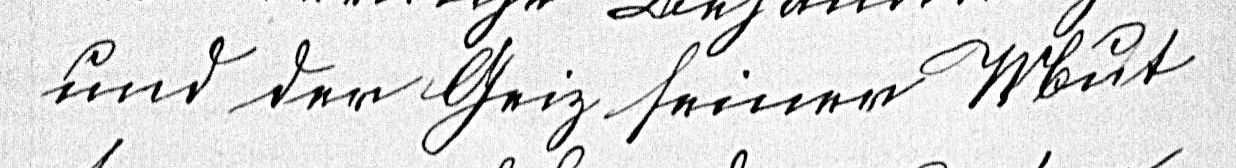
und der Geiz seiner Mut¬
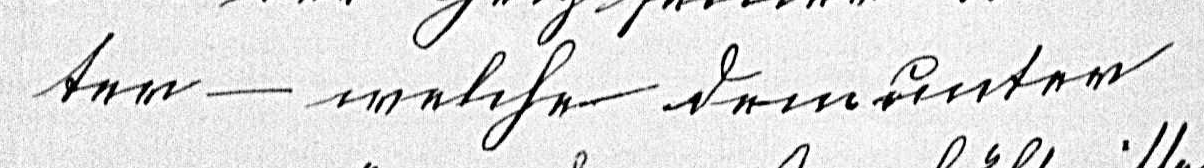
ter – welche dem unter
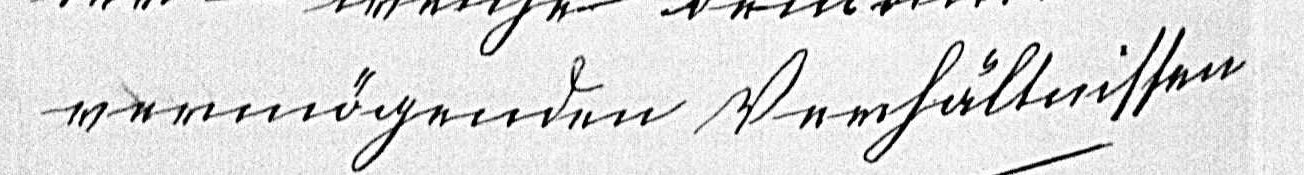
vermögenden Verhältnissen
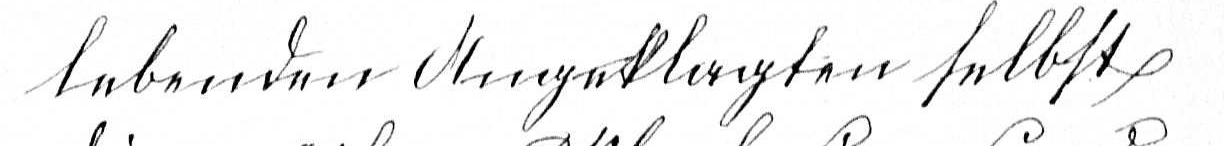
lebenden Angeklagten selbst
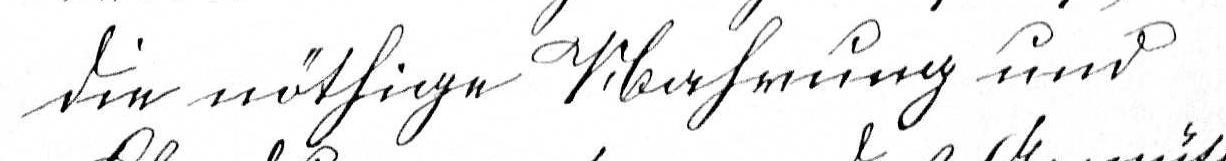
die nöthige Nahrung und
